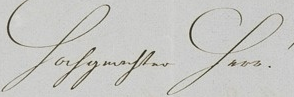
Hochgeachter
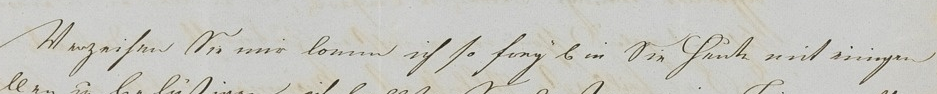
Verzeihen Sie mir wenn ich so frey bin Sie heute mit einigen
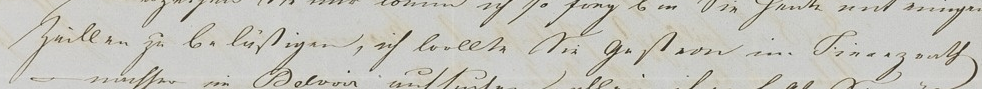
Zeilen zu belästigen, ich wollte Sie gestern im Finanzrath,
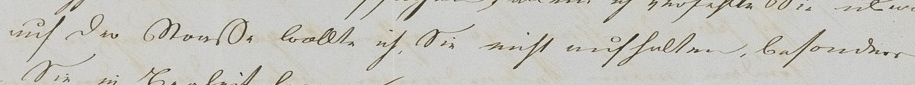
auf der Straße wollte ich Sie nicht aufhalten, besonders
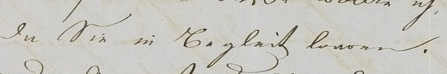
da sie in Begleitung waren.
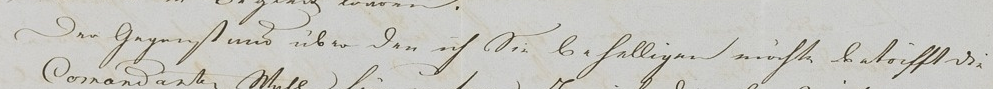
Der Gegenstand über den ich Sie behelligen möchte betrifft die
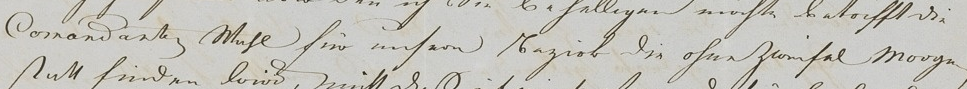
Comandanten Wahl für unsern Bezirk die ohne Zweifel morgen
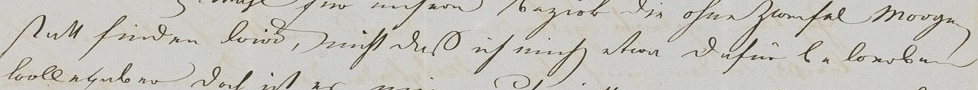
statt finden wird, nicht daß ich mich etwa dafür bewerben
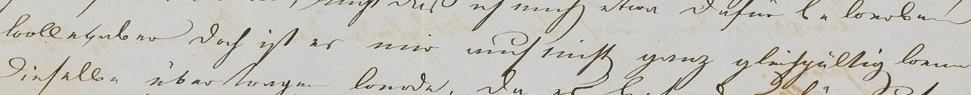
wollet, aber doch ist es mir auch nicht ganz gleichgültig wem
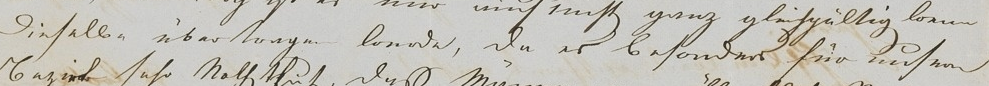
dieselbe übertragen werde, da es besonders für unsern
